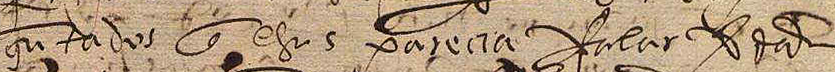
gūtados q̄ lhes parecia falar ꝟdade
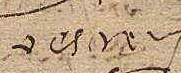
o escrevj
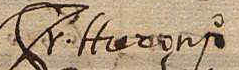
fr. Hieronjo
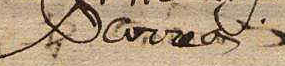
correa
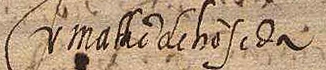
fr mathē de hoyeda
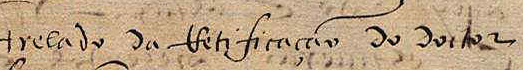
trelado da Retificação do doctor
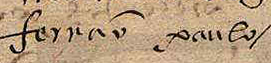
fernaõ paulo/
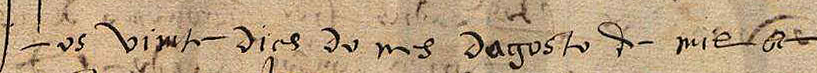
Aos vimte dias do mes dagosto de mil bc
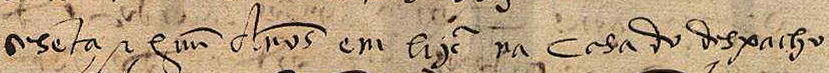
sesēta e hūu An̄os em lixa na casa do despacho
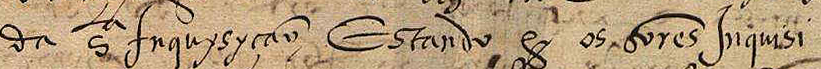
da sta Jnquysyção Estando hy os s̄ores Jnquisi
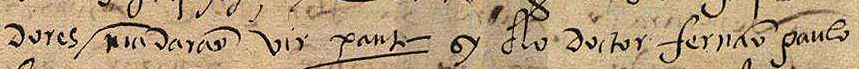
dores mādarão vir ꝑante sy Ao doctor fernão paulo
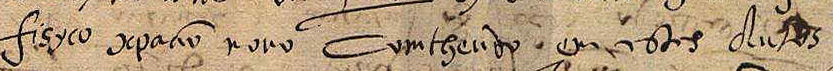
fisyco xpaão nouo Comtheudo em estes Autos
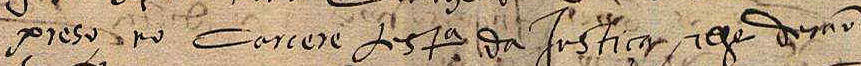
preso no Carcere testa da Justiça e lhe derão
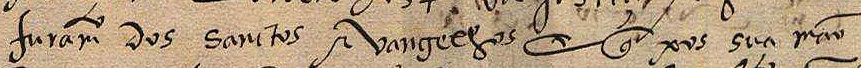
Juramto dos sanctos evangelhos ē q̄ pos sua mão
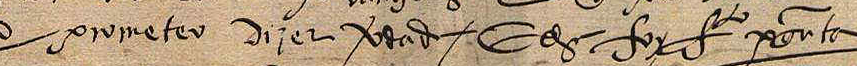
e prometeo dizer ꝟdade / E lhe foy fto ꝑgūta
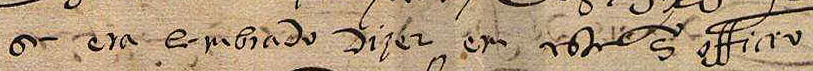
se era lembrado dizer em este Sto officio
